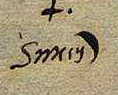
Snres̄
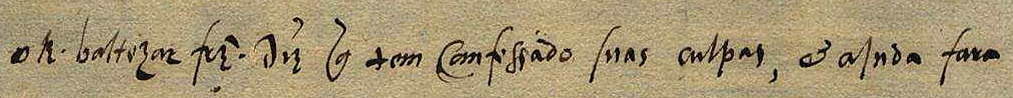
o R. baltezar frz̄. diz q̄ tem Comfessado suas culpas, & aJnda fara
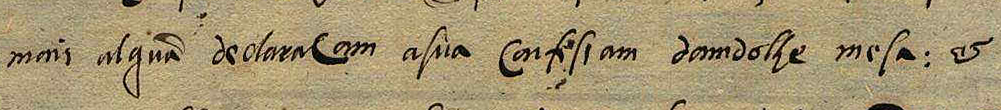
mais alguā declaraCam a sua Confissam damdolhe mesa. &
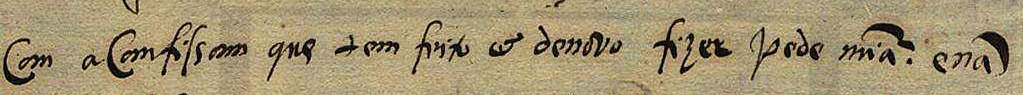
Com a Comfissam que tem feito & de novo fizer pede mīa. e nā
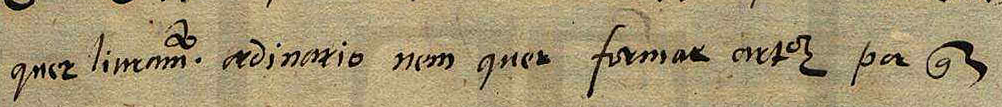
quer liuramto. ordinario nem quer formar artos porq̄
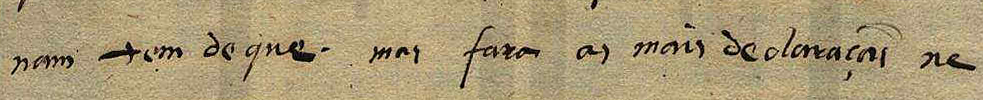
nam tem de que. mas fara as mais declaraçoĩs ne
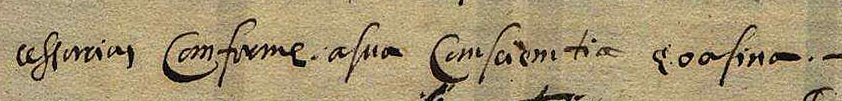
cessarias Comforme a sua Comsciemtia & o asina.
